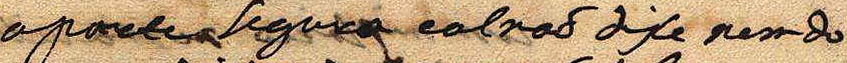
a parte segura e al naõ disse nem do
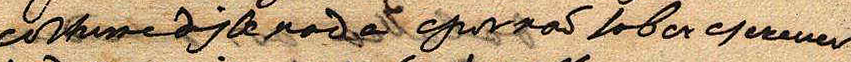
costume disse nada e por naõ saber escreuer
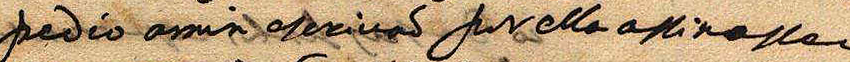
pedio a min escriuaõ por ella assinasse
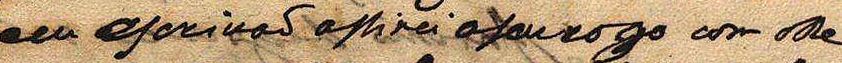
e eu escriuaõ assinei a seu rogo com o Re
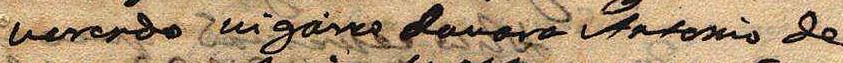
uerendo uigairo da uara Antonio de
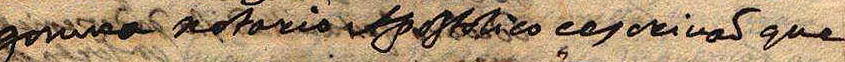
gouuea notario Apostolico e escriuaõ que
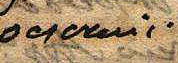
o escreui.
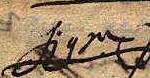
figra
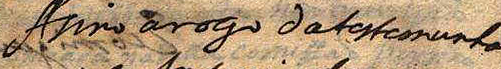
Asino a rogo da testemunha
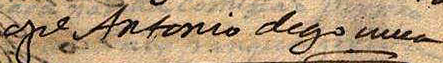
o pe Antonio de gouuea
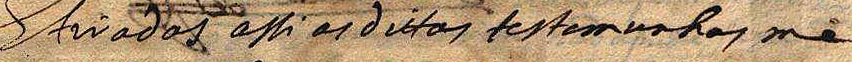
E tiradas assi as dittas testemunhas me
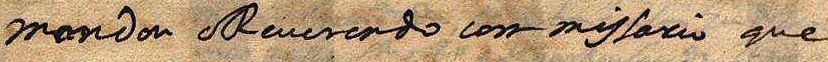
mandou o Reuerendo commissario que
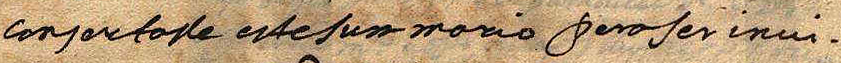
consertasse este summario pera ser inui
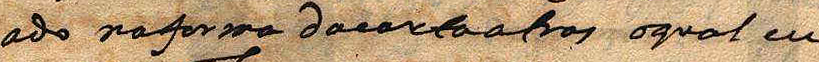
ado na forma da carta atras o qual eu
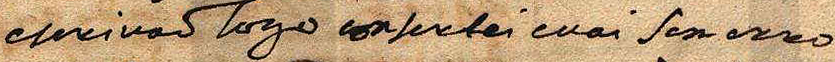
escriuão logo consertei e uai sem erro
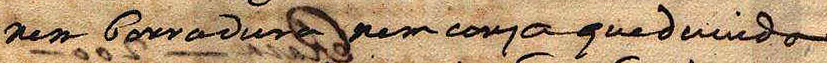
nem borradura nem couza que duuida
